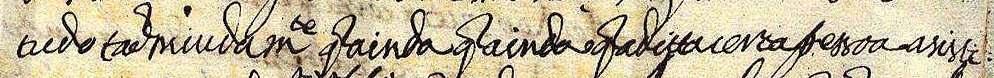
tudo taõ muidamte q̄ ainda q̄ ainda q̄ a ditta certa pessoa asisti
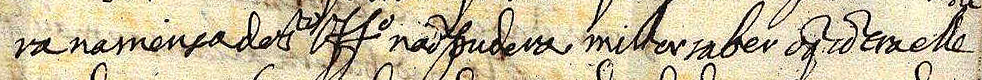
ra na mensa do sto Offo naõ pudera milhor saber o q̄ cōtra elle
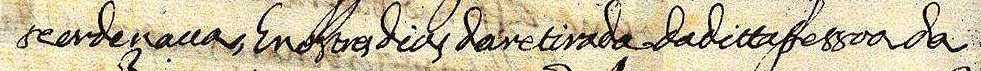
se ordenaua, E nos tres dias da retirada da ditta pessoa da
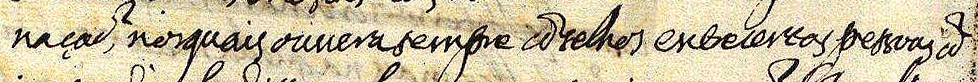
naçaõ, nos quais ouuera sempre cōselhos entre certas pessoas cō
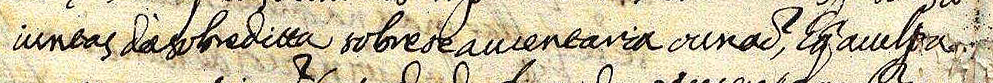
iuntas da sobreditta sobre se ausentaria ou naõ, E q̄ a culpa
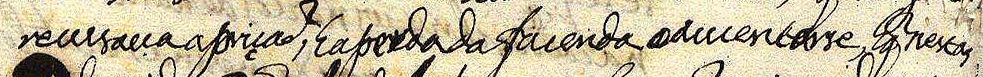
recusaua a priçaõ, E aperda da facenda aucentarse, E q̄ nestas
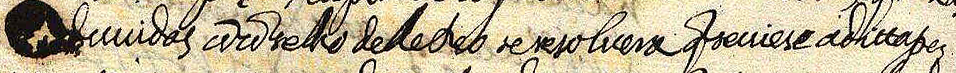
duuidas cō cōselho delle Reo se resoluera q̄ se uiese a ditta pes
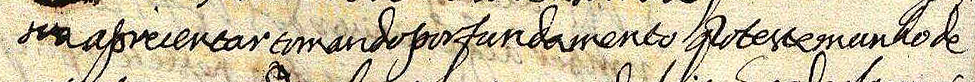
soa aprecentar tomando por fundamento q̄ o testemunho de
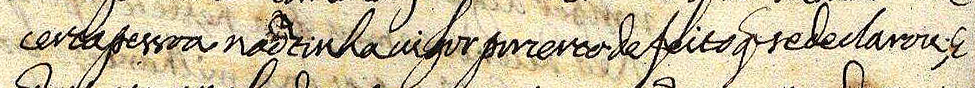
certa pessoa naõ tinha uigor por certo defeito q̄ se declarou, E
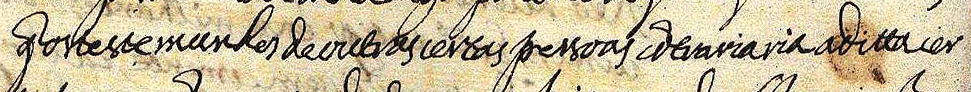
q̄ os testemunhos de outras certas pessoas cōtrariaria a ditta cer
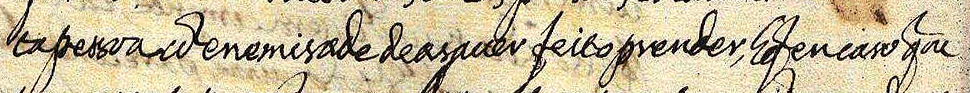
ta pessoa cō enemisade de as auer feito prender, E q̄ en caso q̄ ou
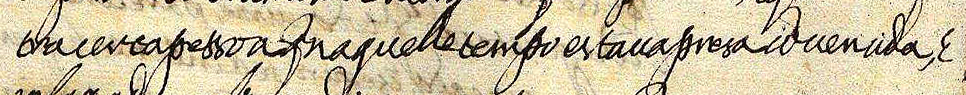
tra certa pessoa q̄ naquelle tempo estaua presa cōuencida, E
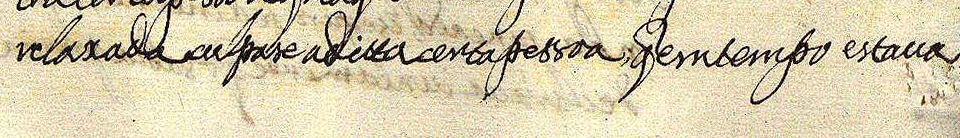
relaxada culpase a ditta certa pessoa, q̄ em tempo estaua
